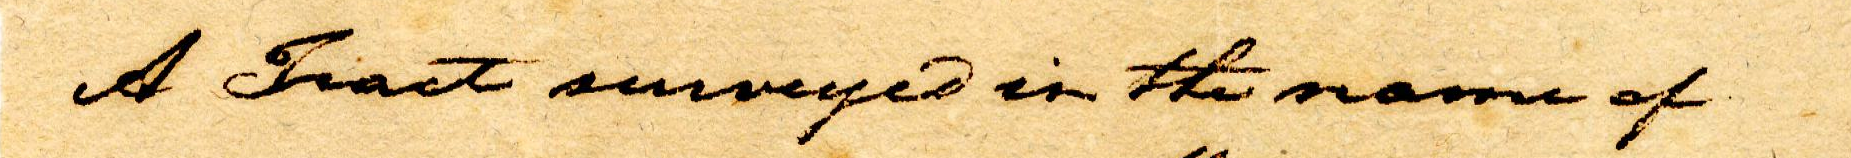A Tract surveyed in the name of
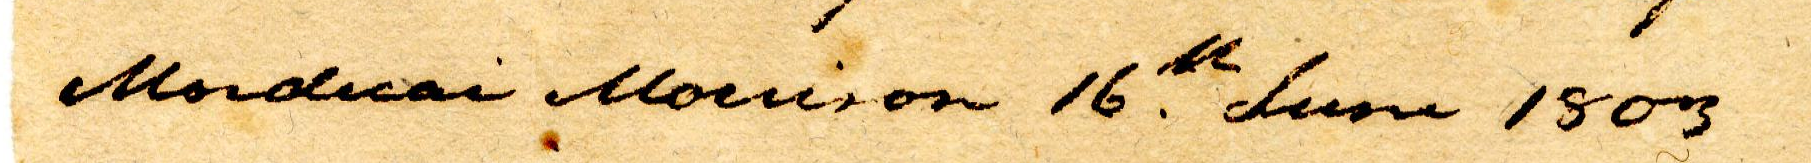Mordecai Morison 16^th. June 1803
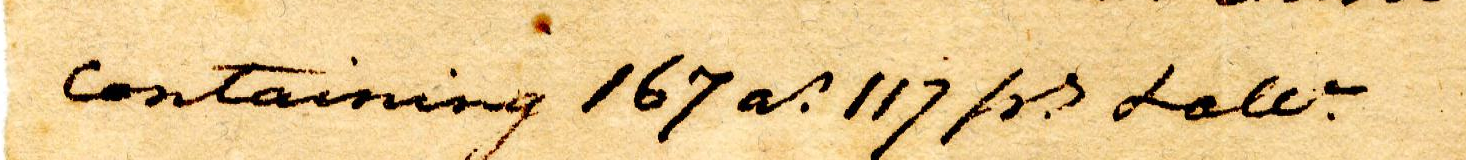containing 167 @ 117 p^s. Lall^a.
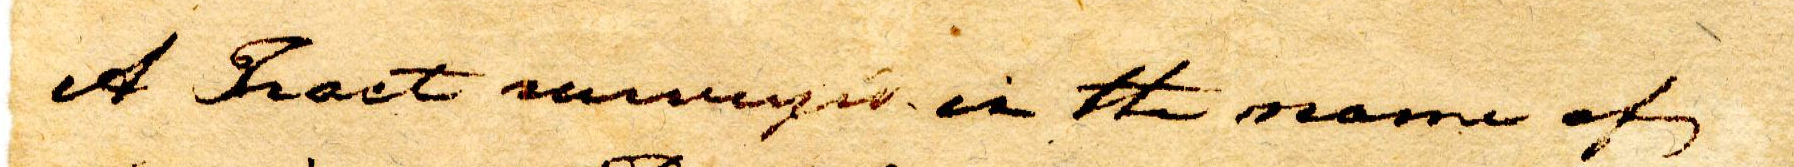A Tract surveyed in the name of
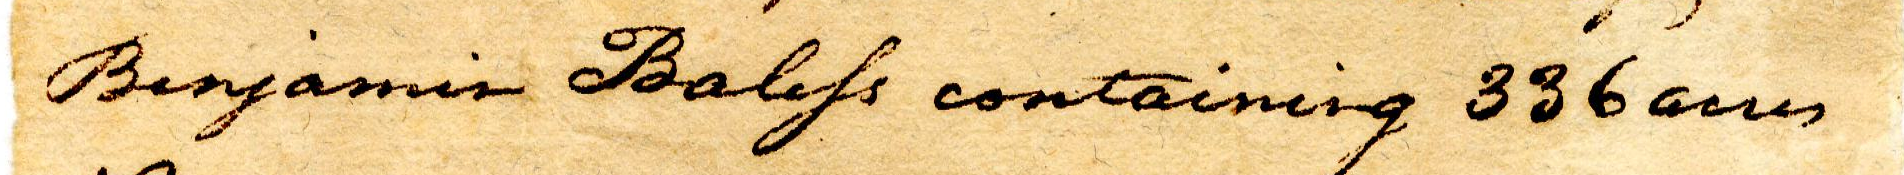Benjamin Baless containing 336 acres
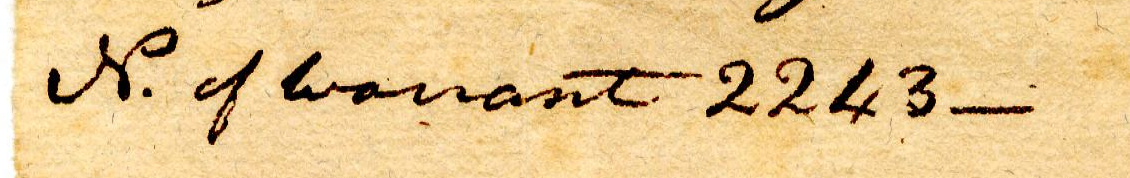N. of warrant 2243-
